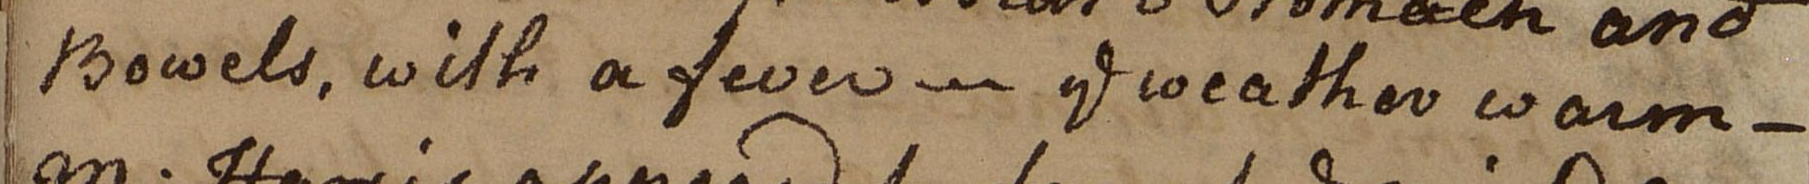Bowels, with a fever- y^e weather warm-
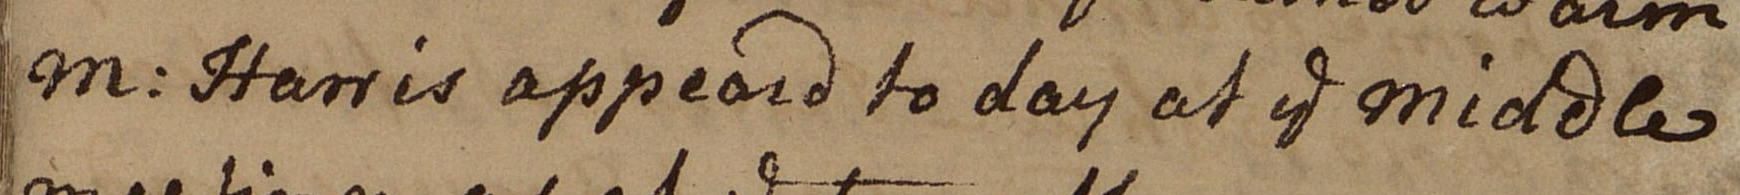M: Harris appeard to day at y^e middle
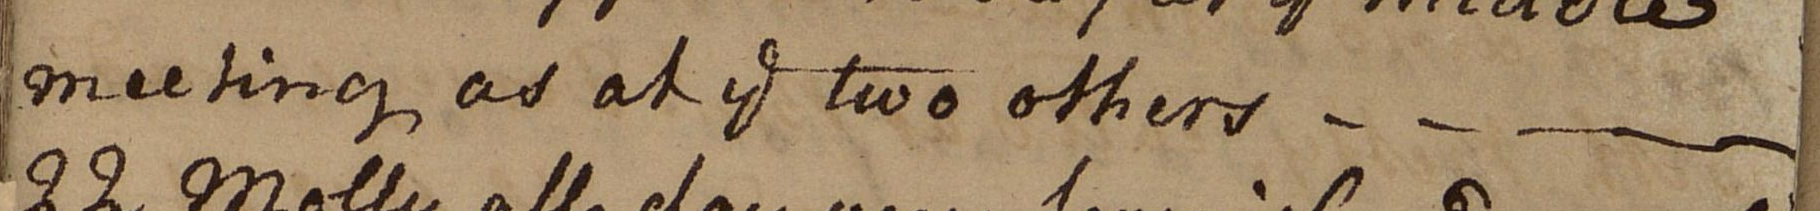meeting as at y^e two others---
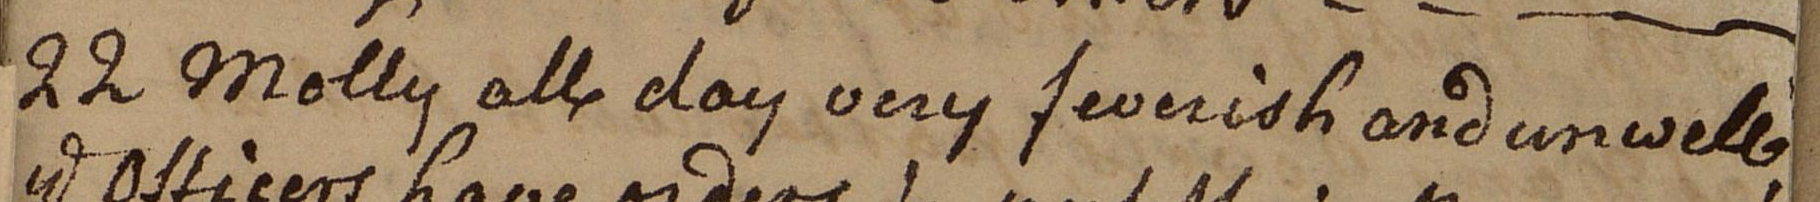22 Molly all day very feverish and unwell,
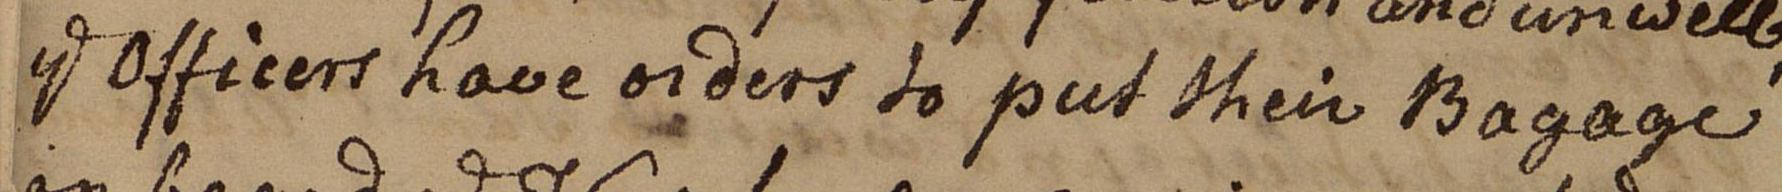y^e Officers have orders to put their Bagage
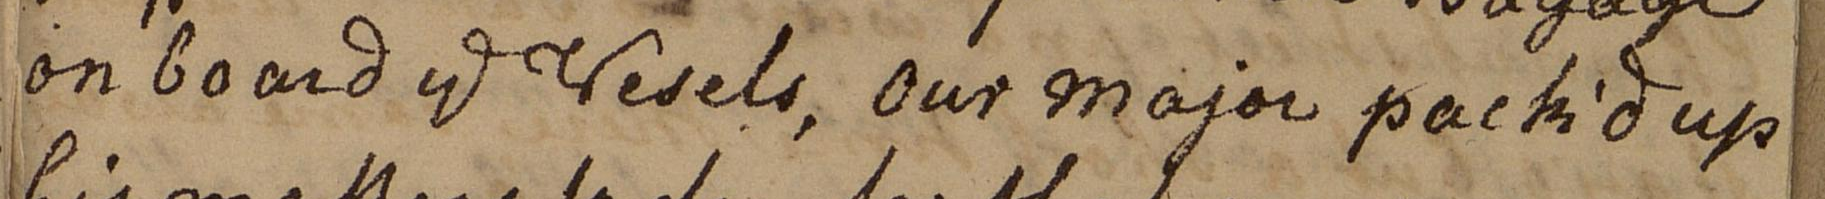on board y^e Vesels, our Major pack'd up
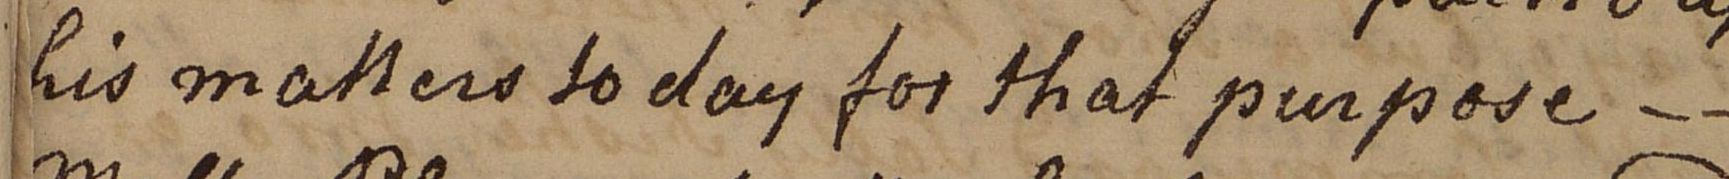his matters to day for that purpose-
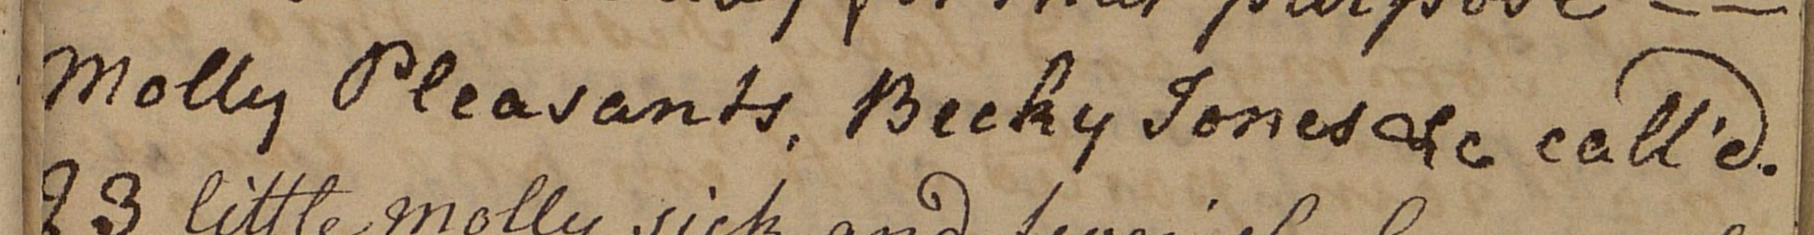Molly Pleasants, Becky Jones &c call'd.
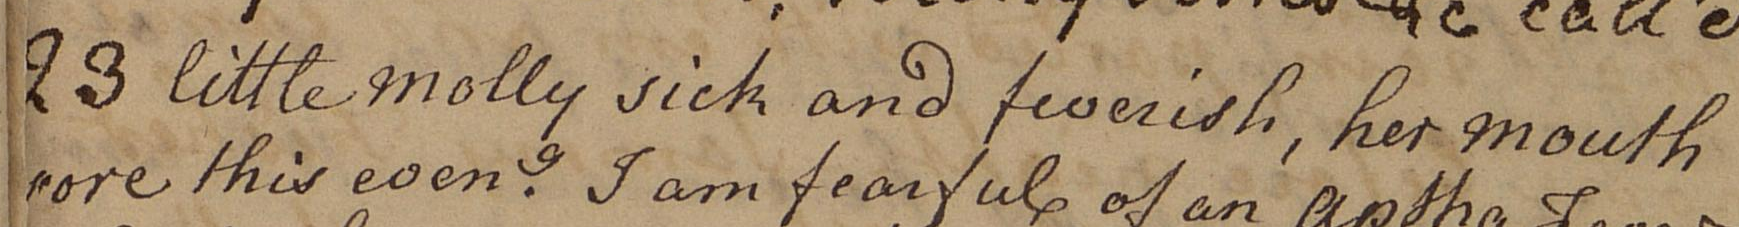23 little molly sick and feverish, her mouth
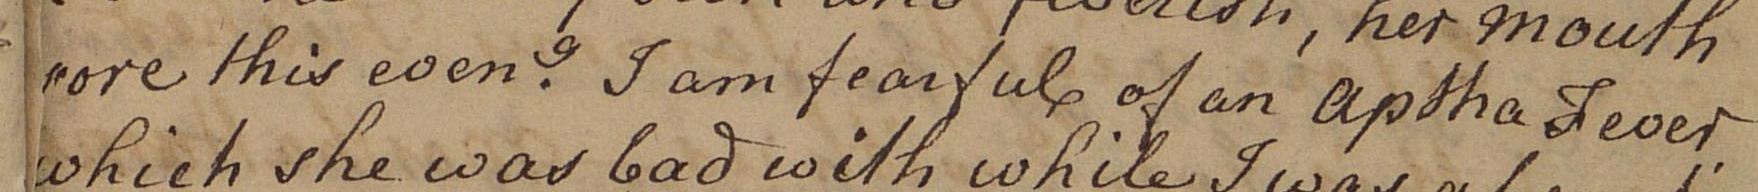sore this even^g. I am fearful of an Aptha Fever.
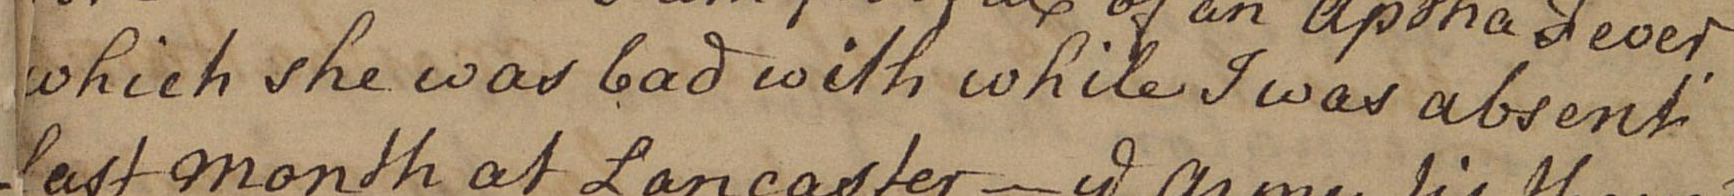which she was bad with while I was absent
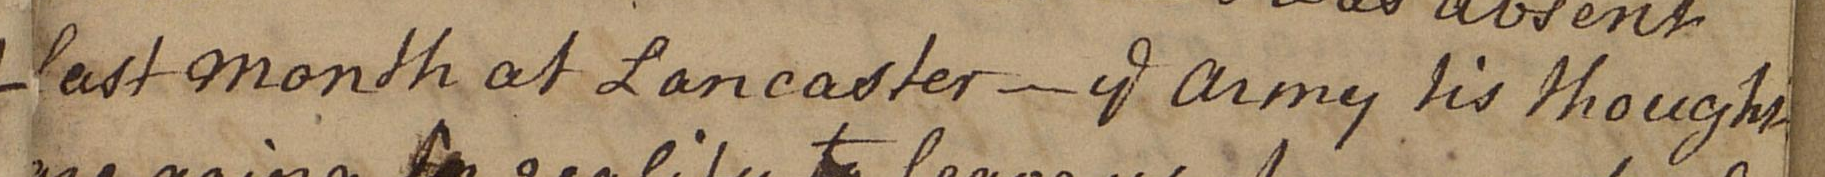last month at Lancaster- y^e army tis thought
